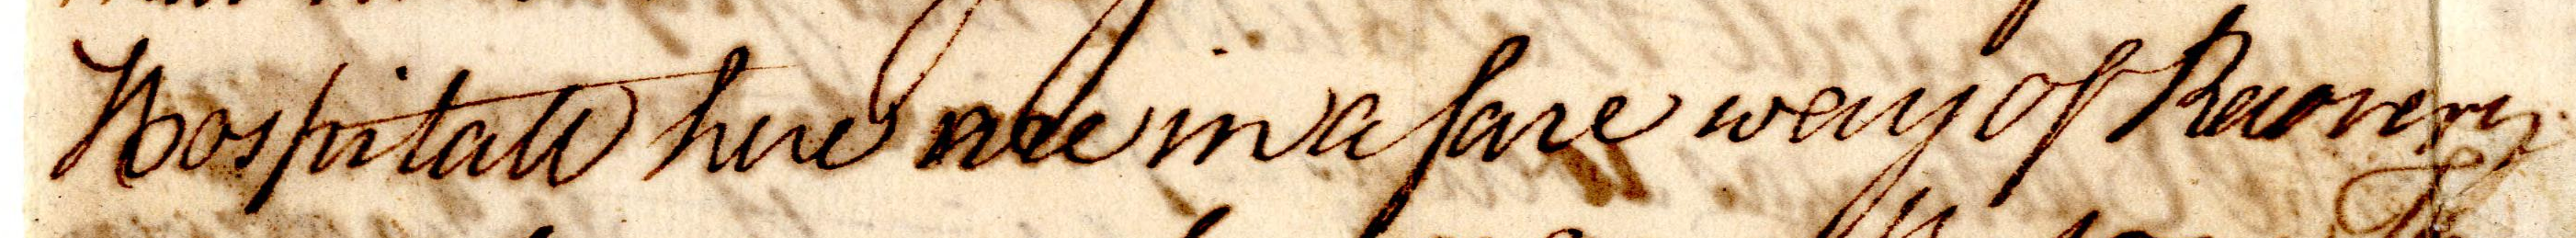Hospitall here are in a fare way of Recovery
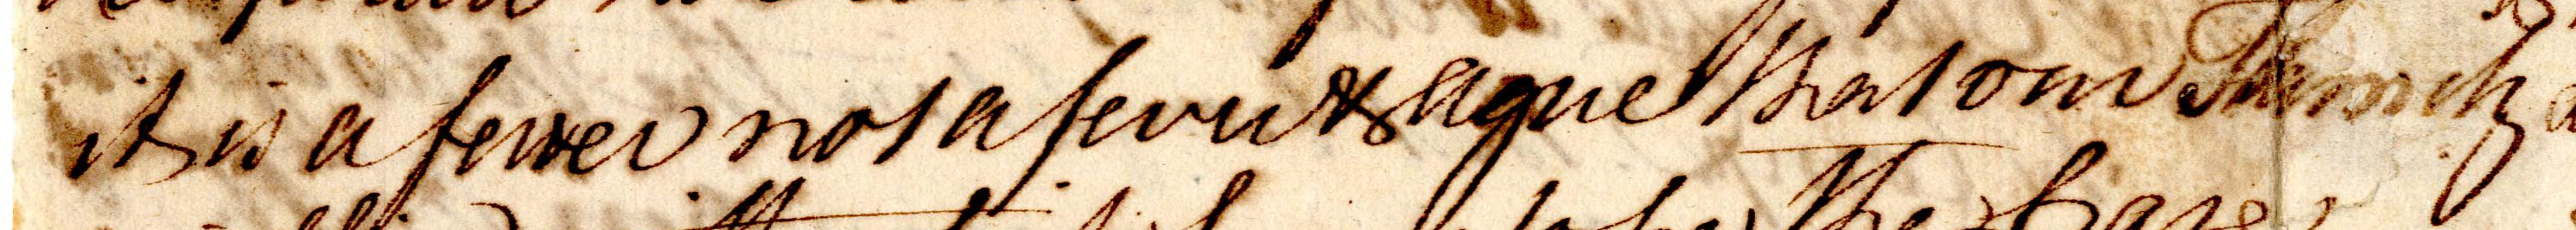it is a fever not a fever & ague that our Family
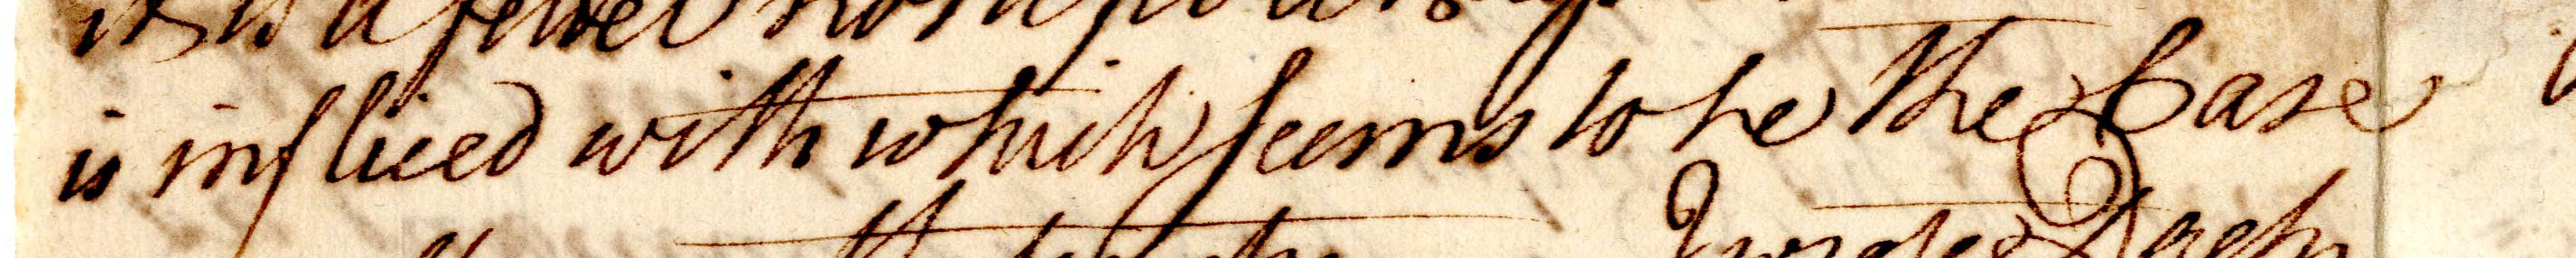is infliced with which seems to be the Case
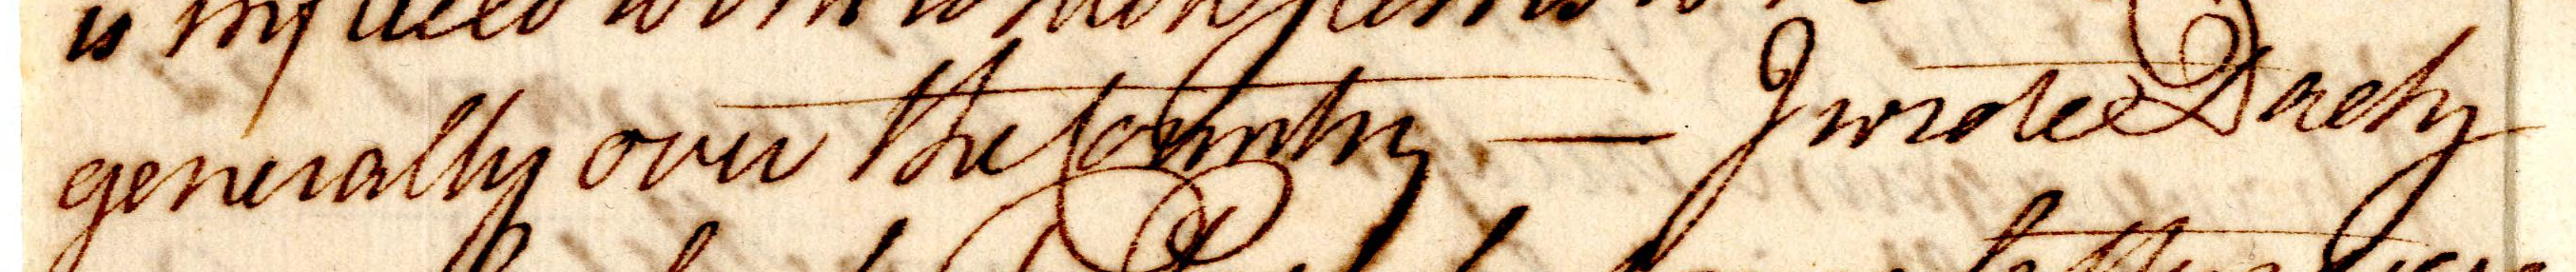generally over the Country. I wrote Daety
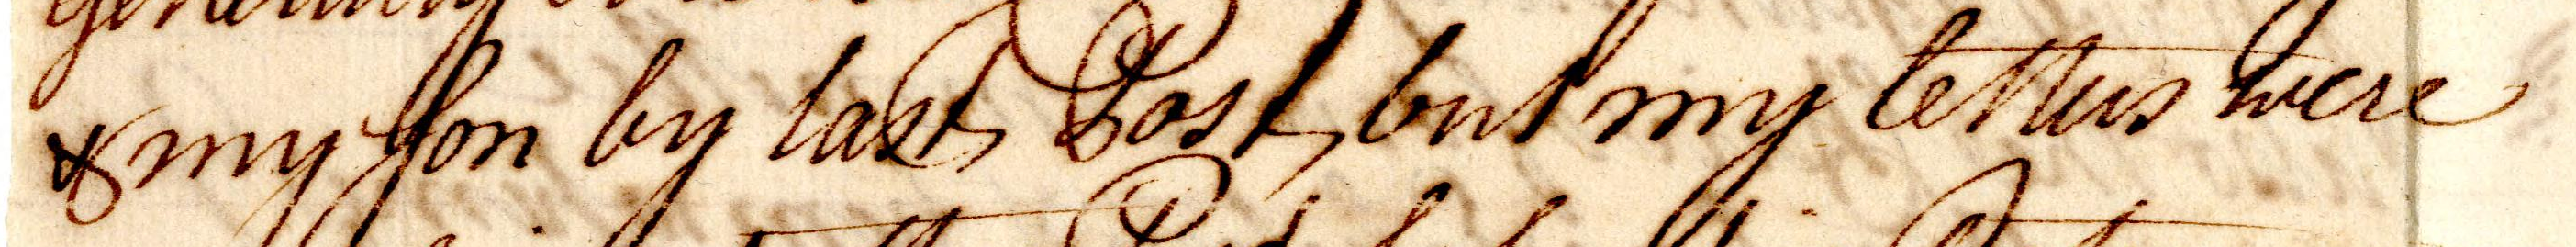& my Son by last Post, but my letters were
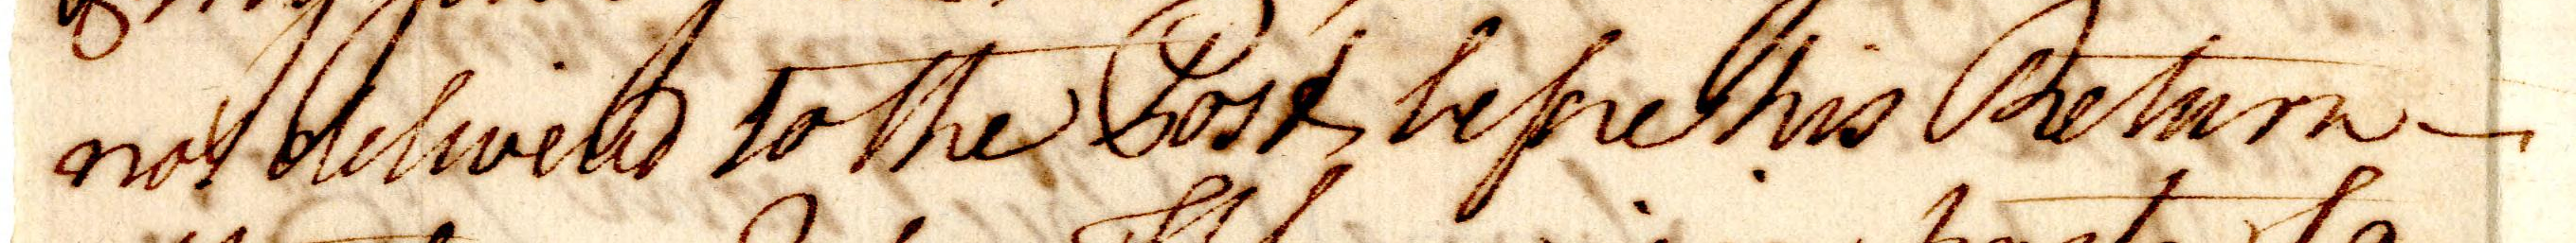not delivered to the Post before his Return.
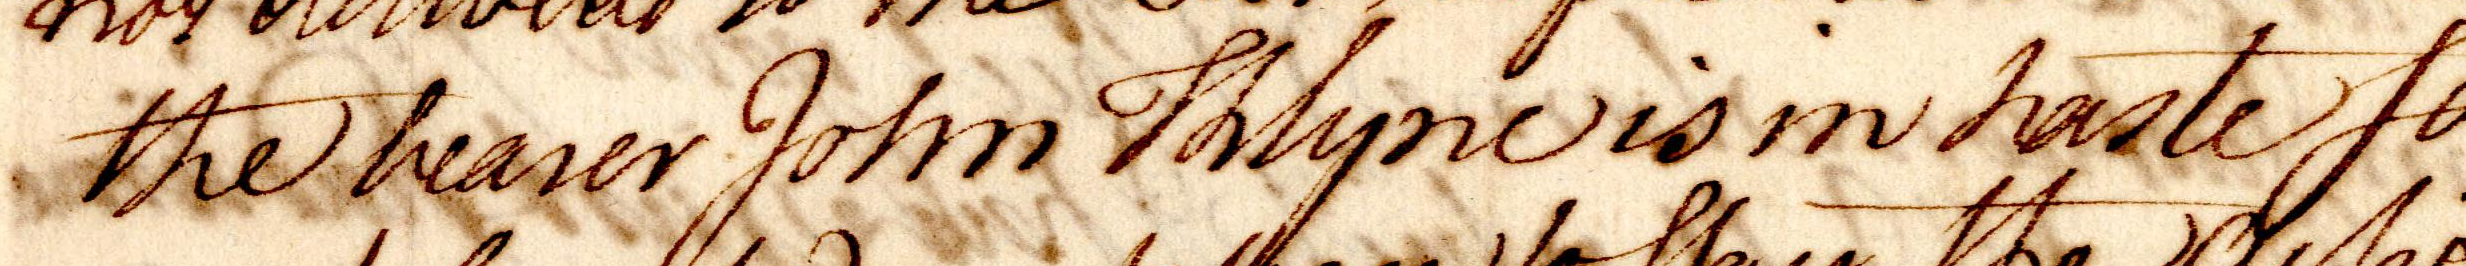the hearer John Thlyne is in haste so
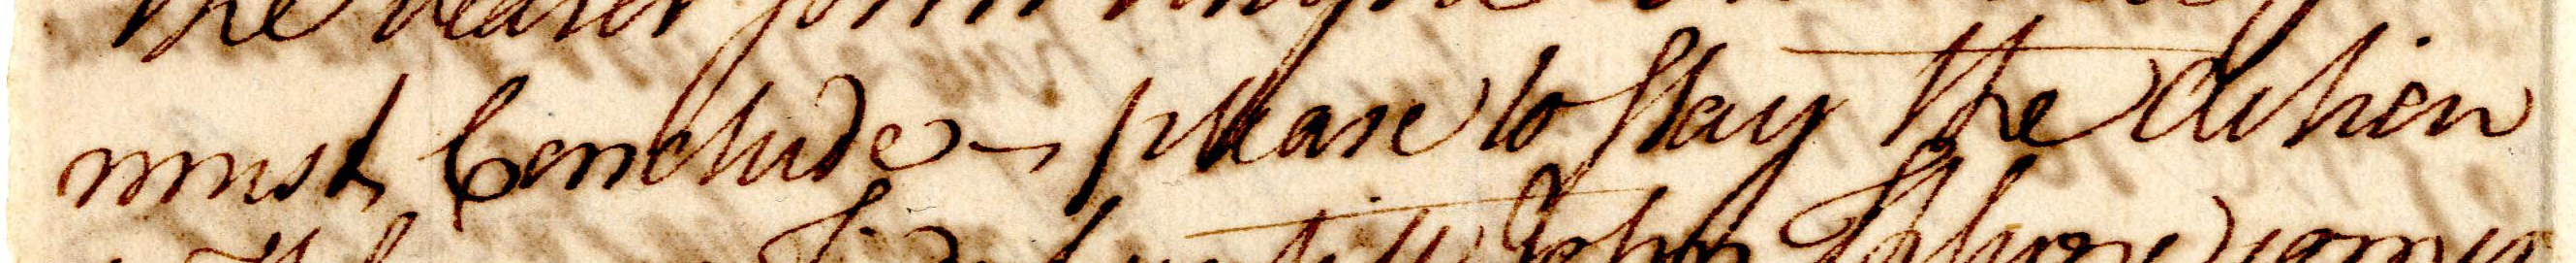must Conclude. please to stay the Aiken
